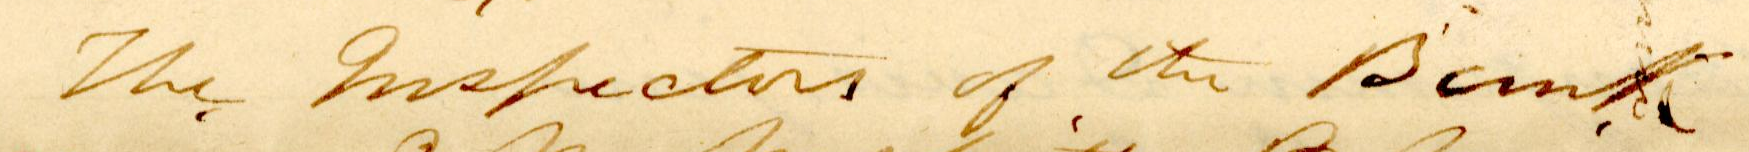The Inspecters of the Bank
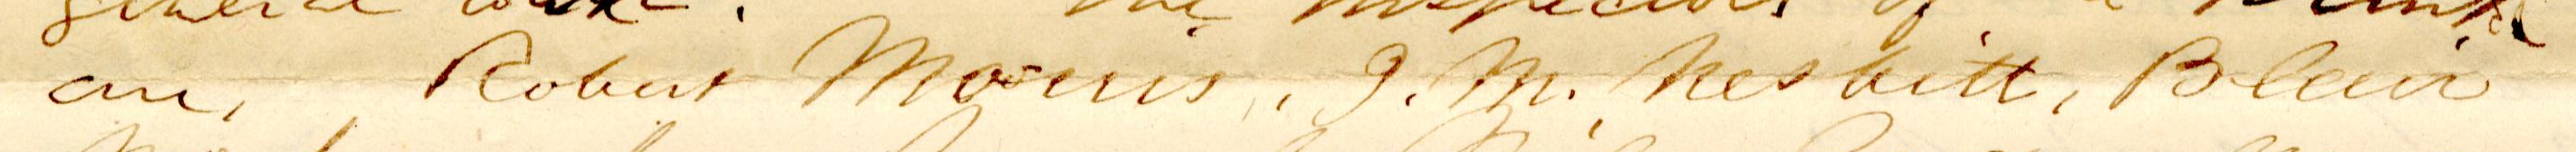one, Robert Morris. J. M. Nesbitt, Blair
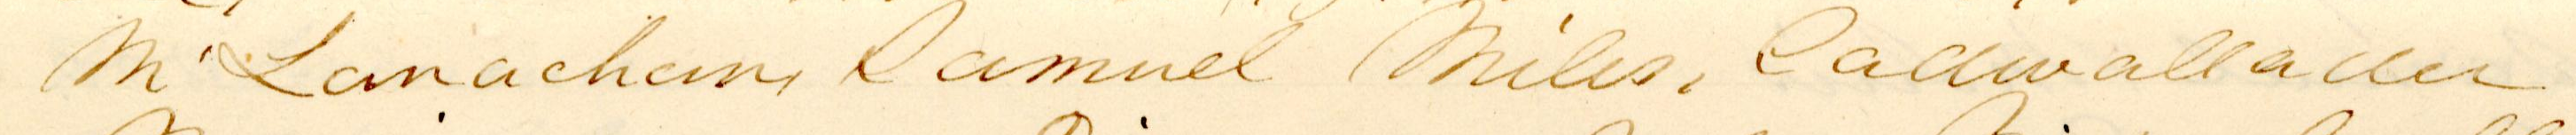M^r Lanachens, Samuel Miles. Cadwallder
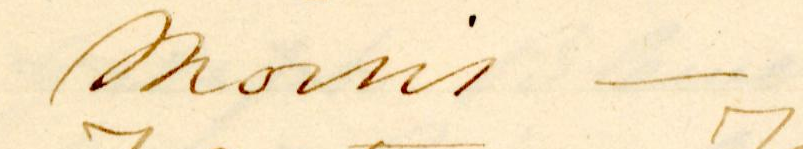Morris-
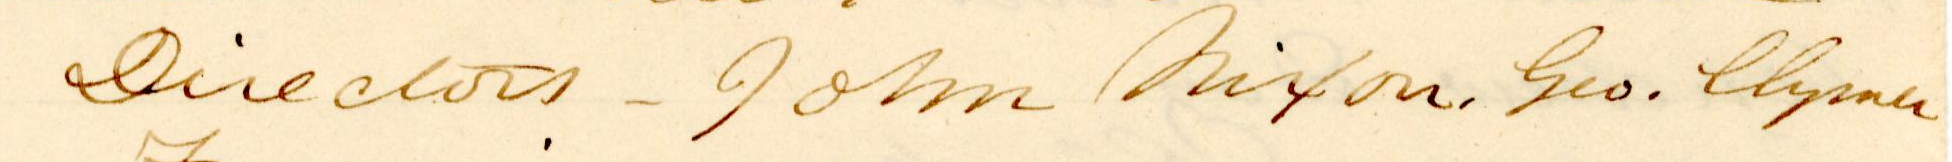Directors- John Brixon, Geo. Clymer
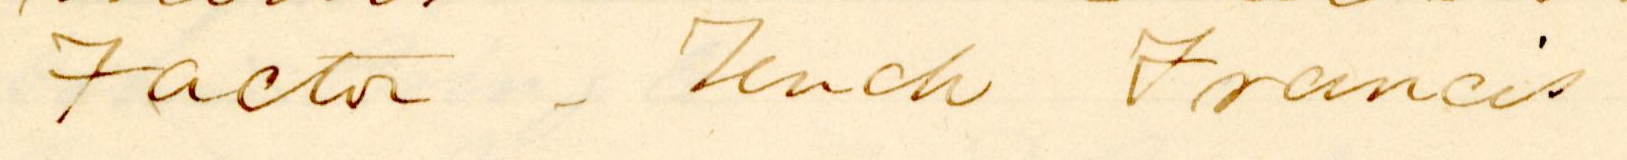Factor - Tench Francis
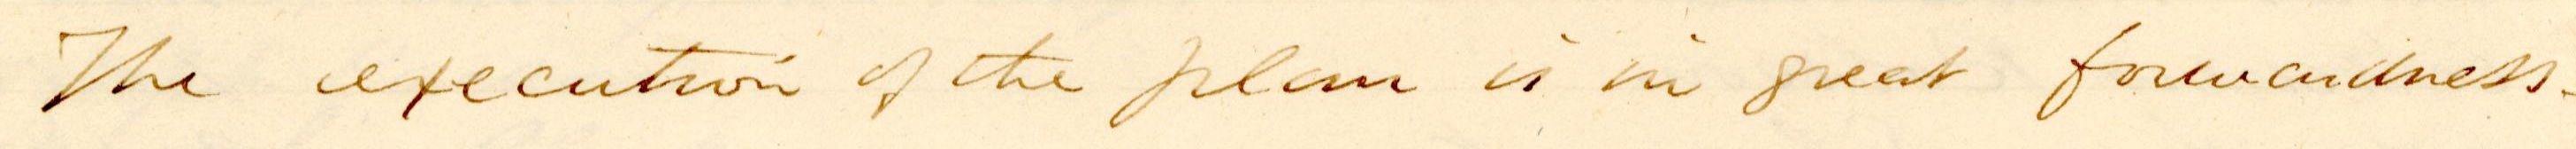The execution of the plan is in great forwardness
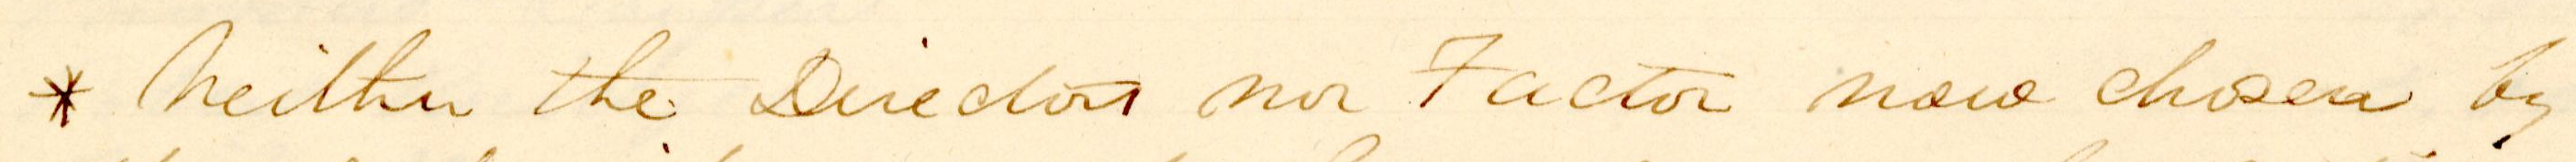* Neither the Directors nor Factor now chosen by
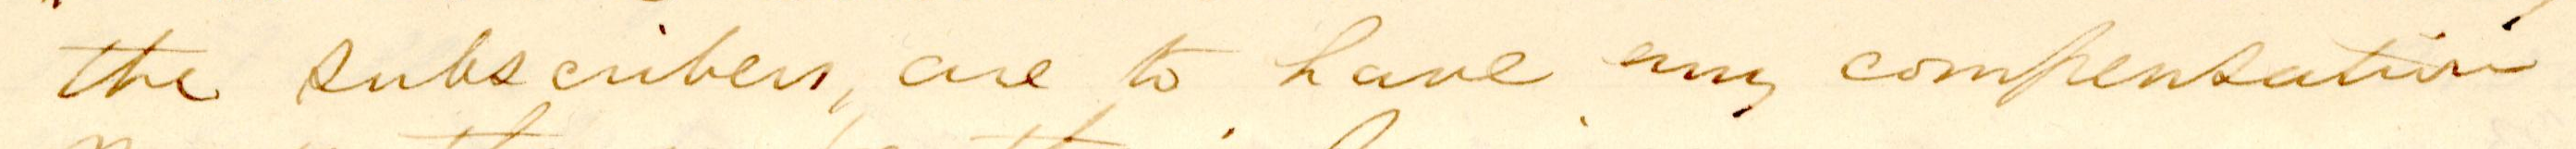the subscribers, are to have any compensation
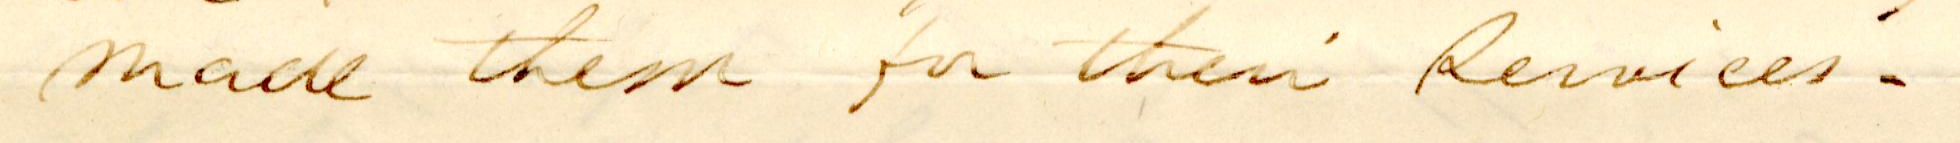made them for their Services-
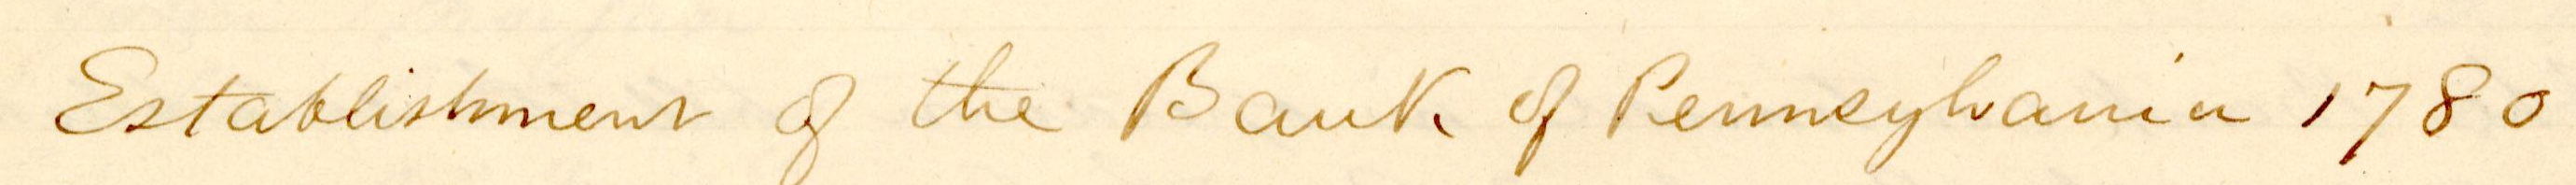Establishment of the Bank of Pennsylvania 1780
